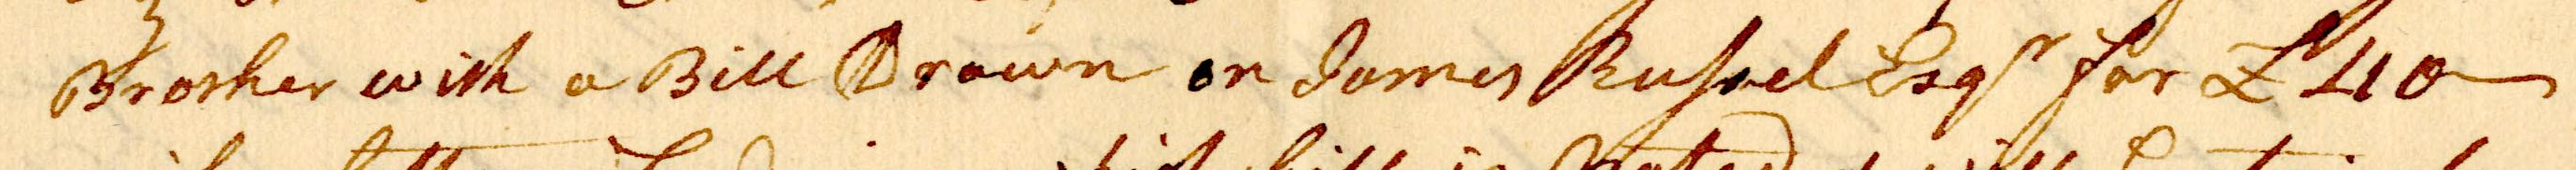Brother with a Bill Drawn on James Russel Esq^r for £40-
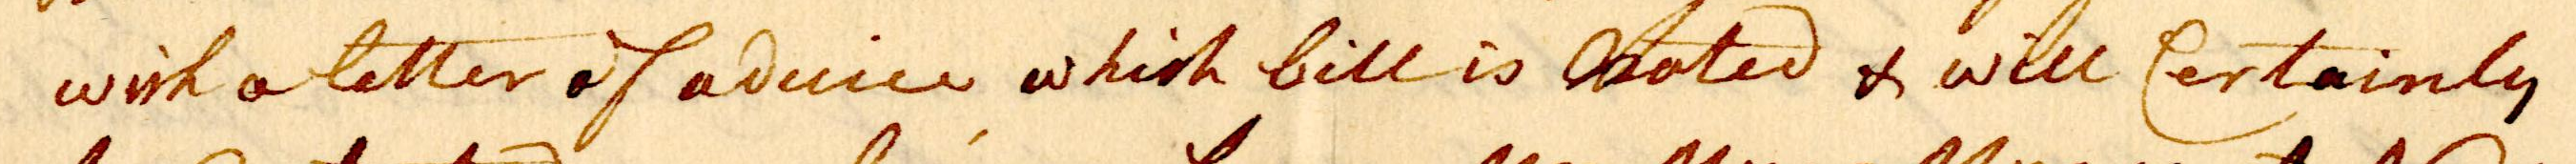wish a letter of advice which bill is Dated & will Certainly
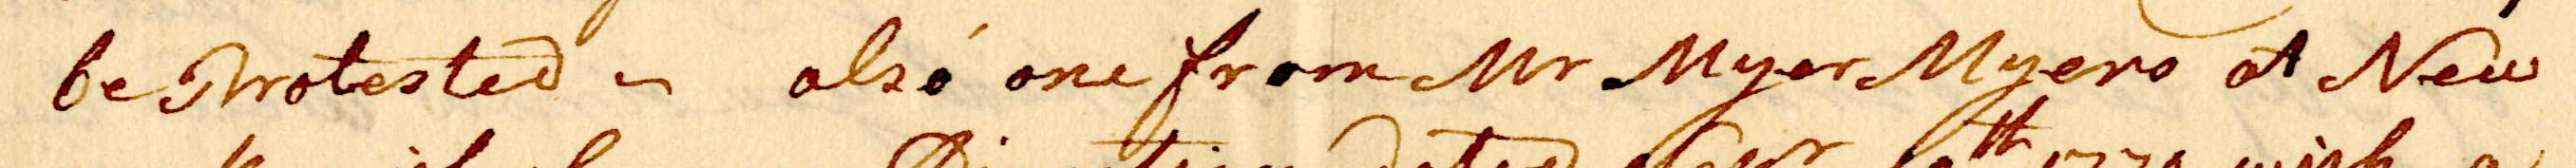be protested- also one from M^r Myer Myers at New
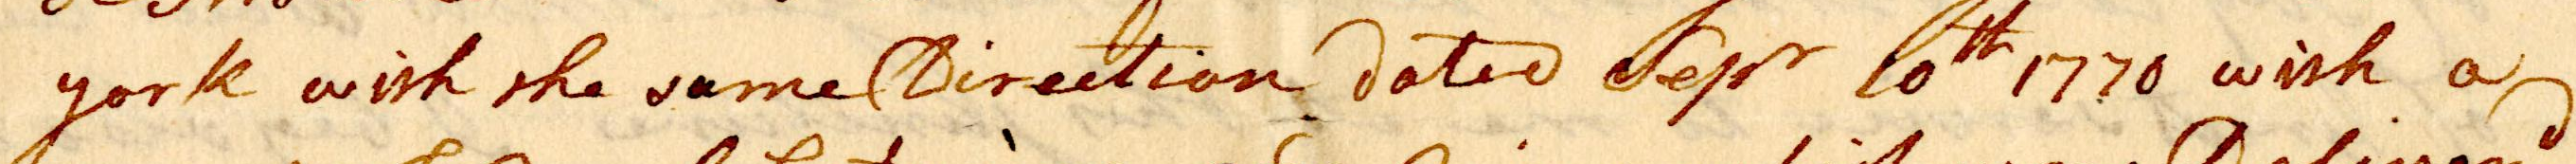York with the same Direction dated Sep^r 10^th 1770 with a
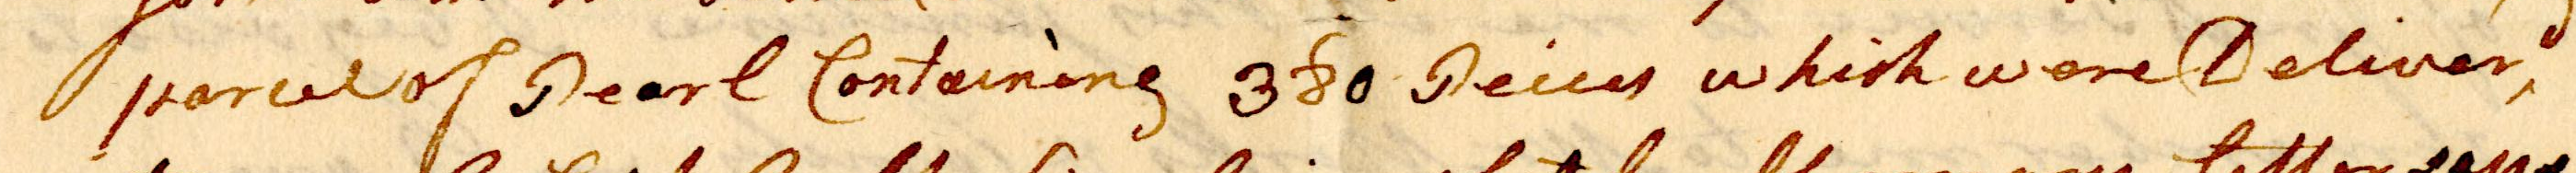parcel of Pearl Containing 380 Pieces which were Deliver^d
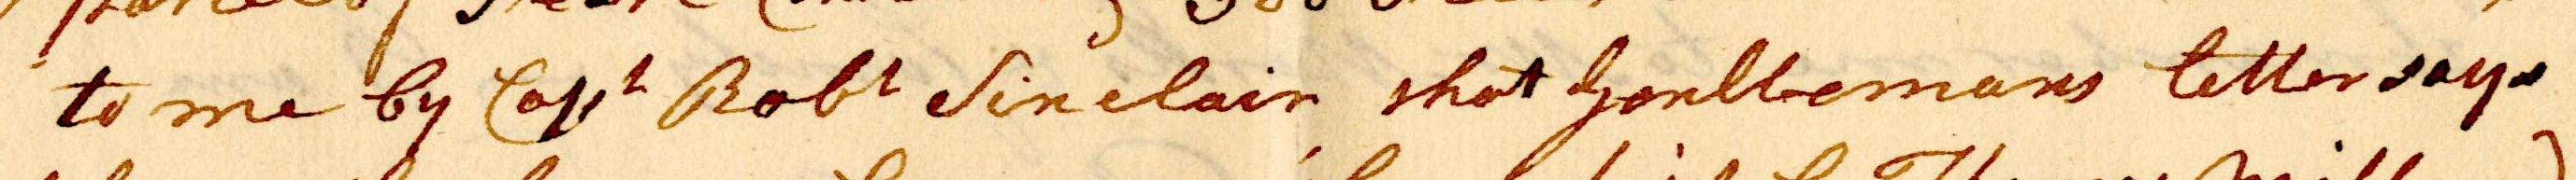to me by Cap^t. Rob^t Sinclair that Gentlemans letter says
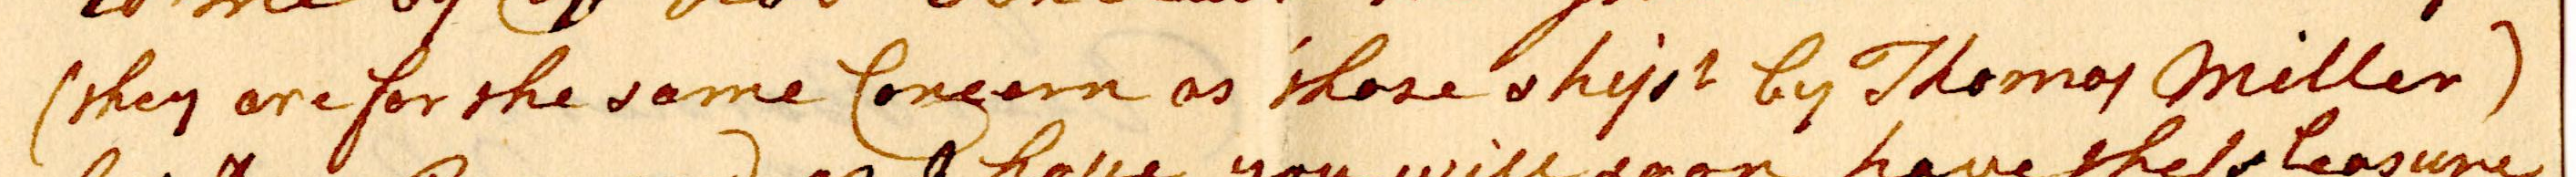(they are for the same Concern as those ship't by Thomas Miller)
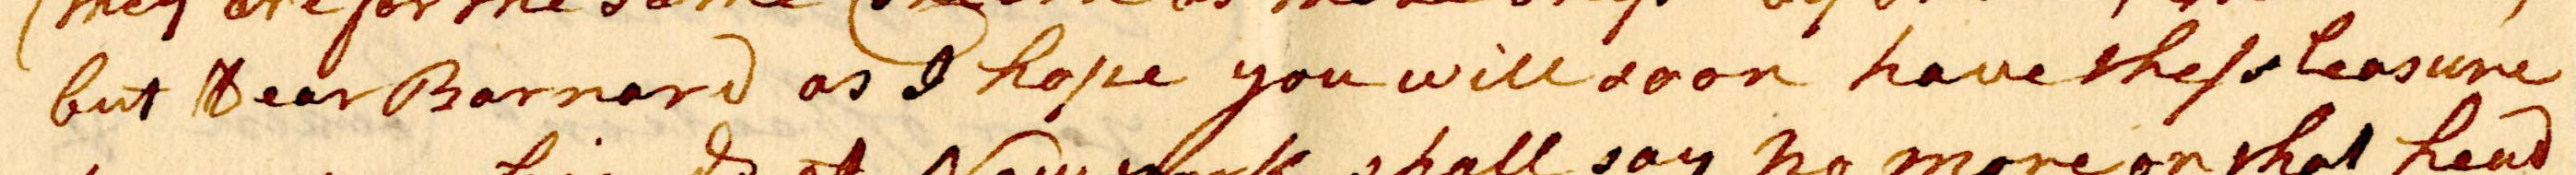but Dear Barnard as I hope you will soon have the pleasure
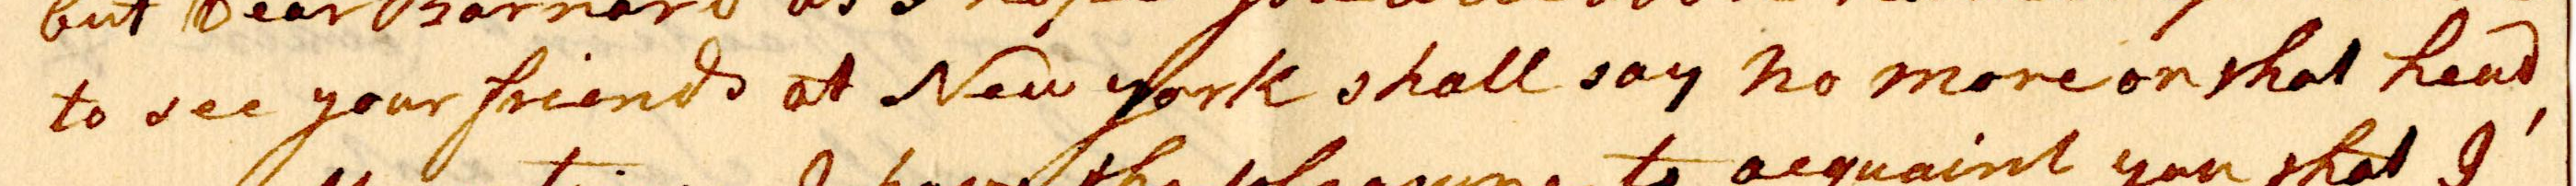to see your friends at New York shall say no more on that head,
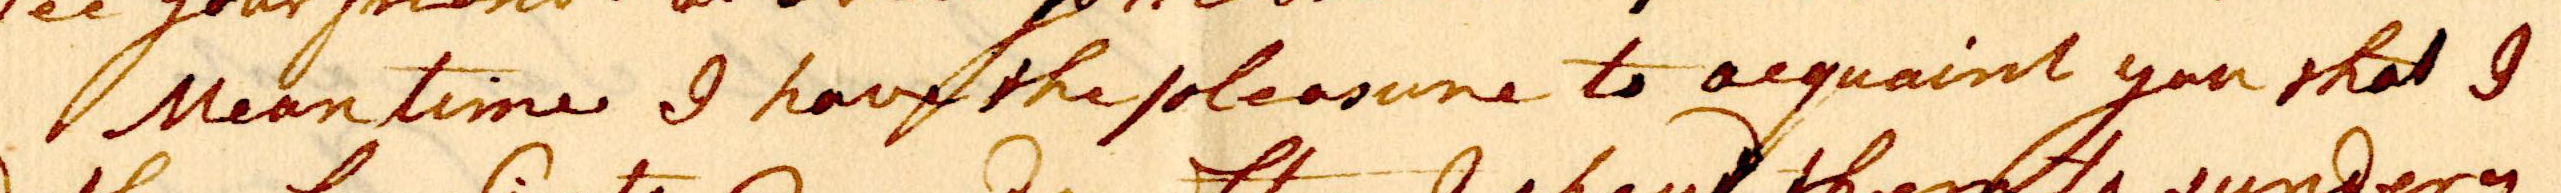Meantime I have the pleasure to acquaint you that I
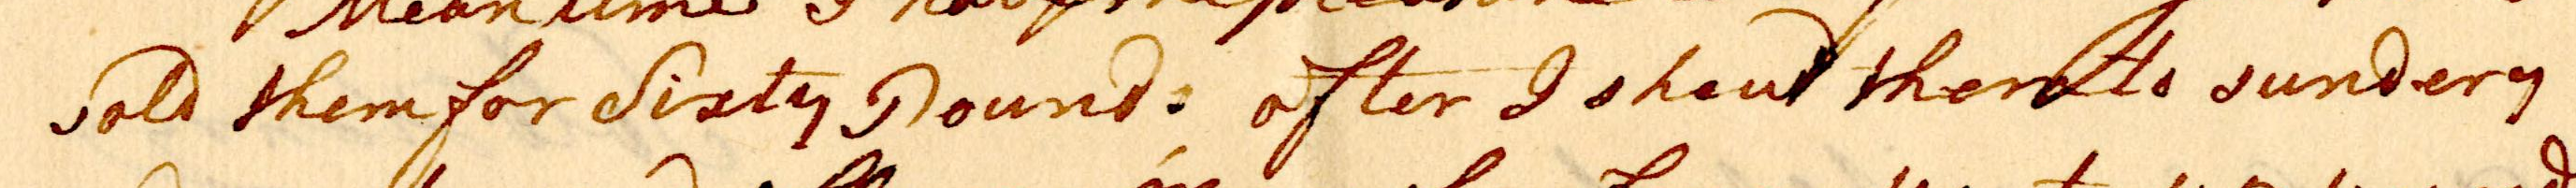sold them for Sixty Pounds after I shoud thereto sundery
